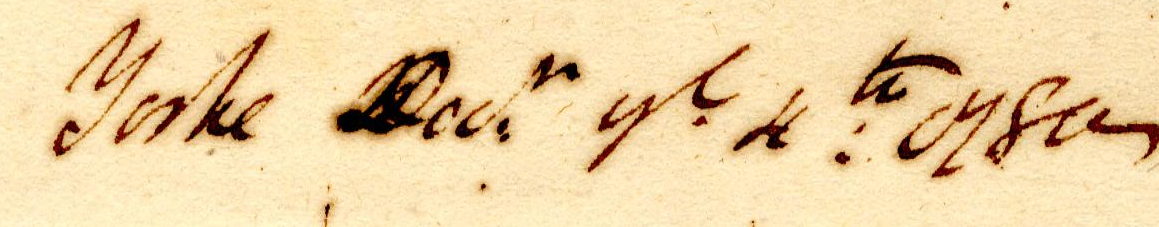Yorke Dec^r. y^e. 4^th. 1780
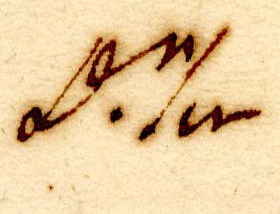D^r. Sir
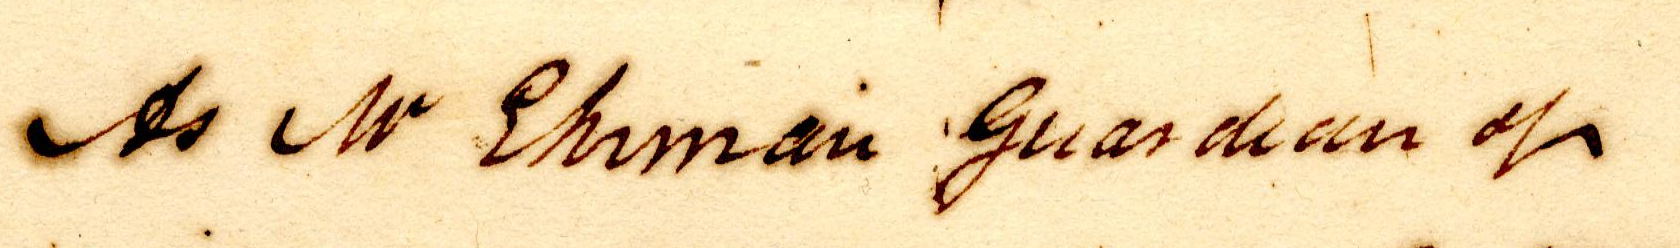As M^r Ehrman Guardian of
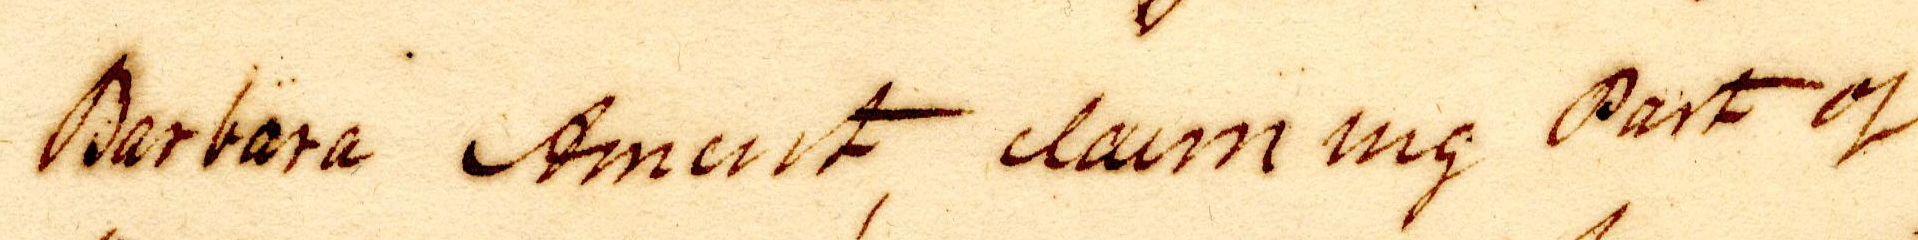Barbara Ancient claiming Part of
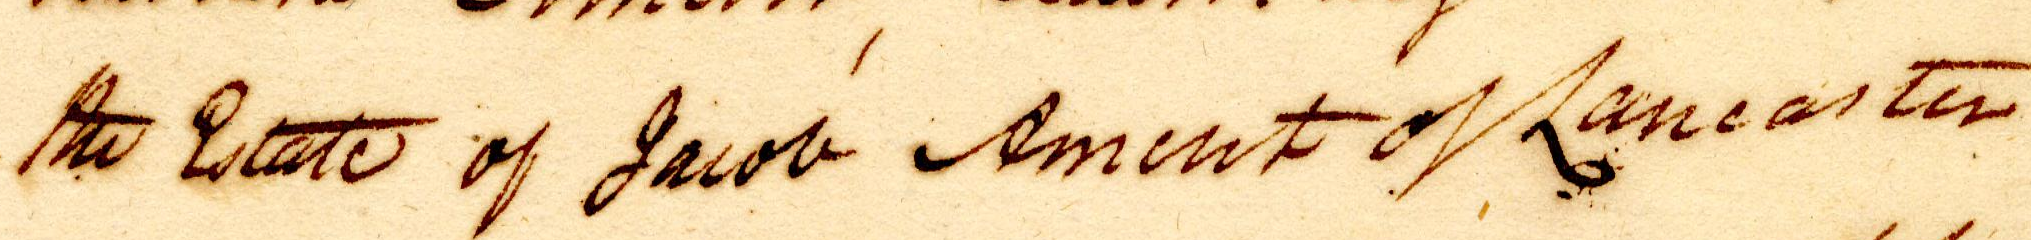to Estate of Jacob Ament of Lancaster
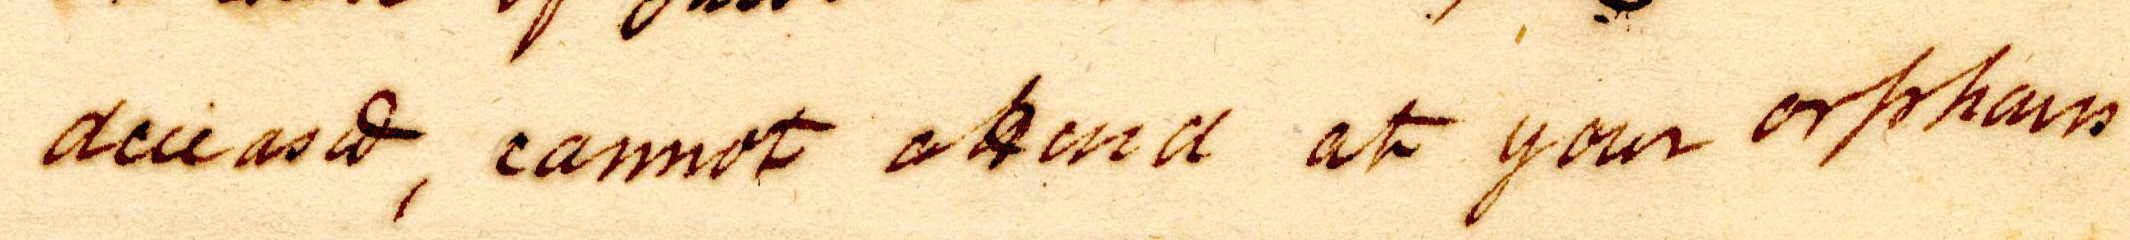deceased, cannot afford at your orphan
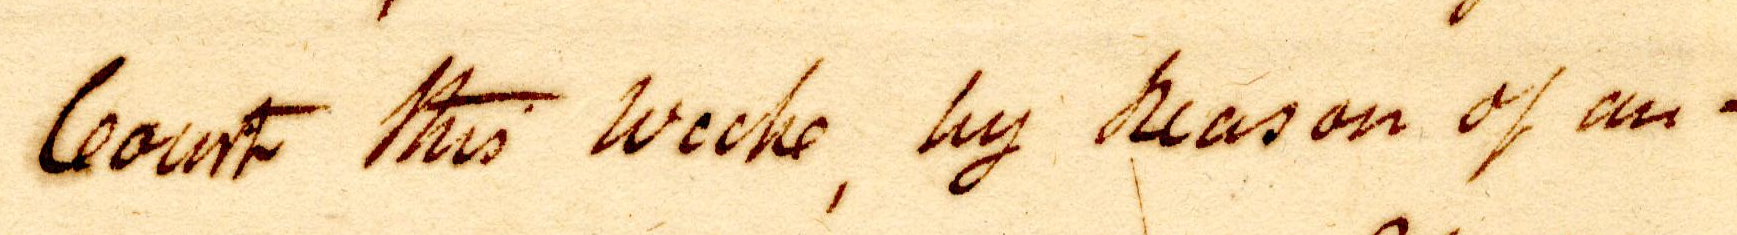Court this week by Reason of an
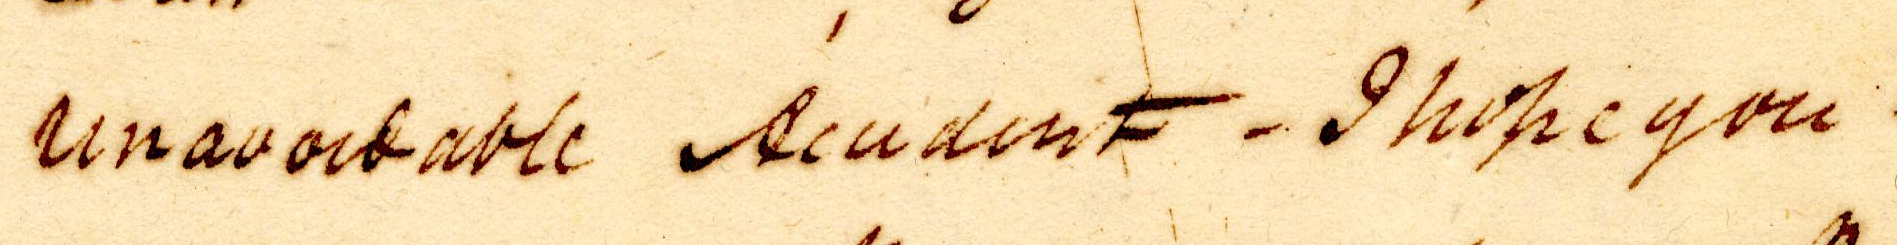Unavoidable Accident. I hope you
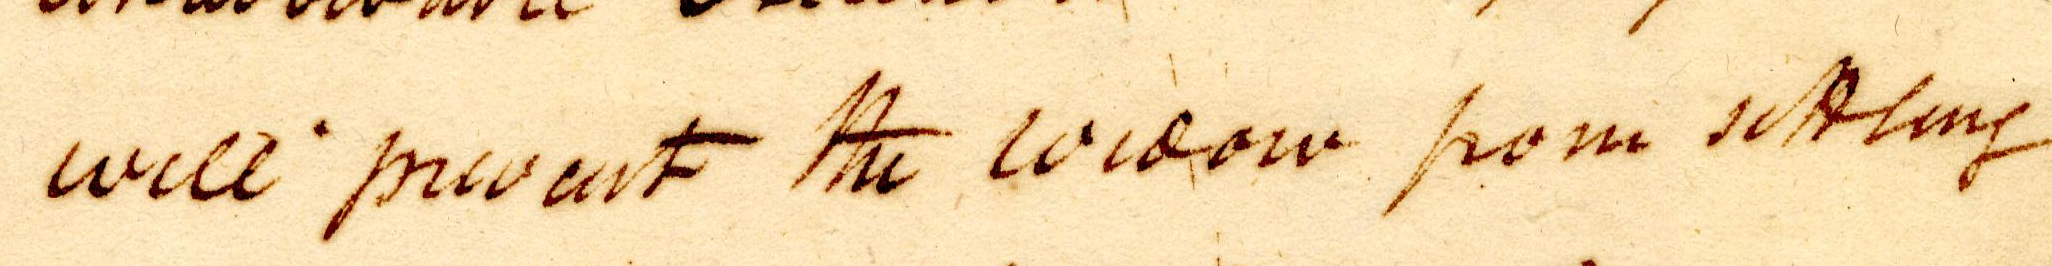will prevent the widow from settling
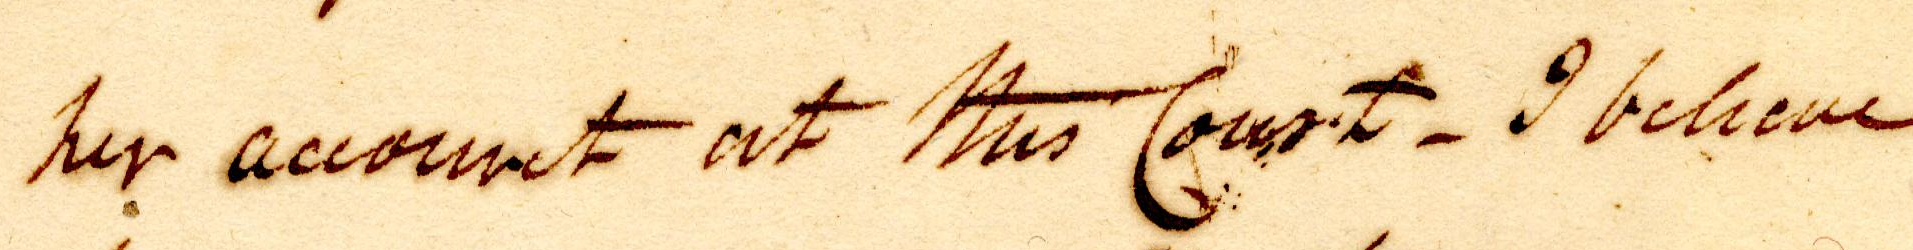her account at this Court. I believe
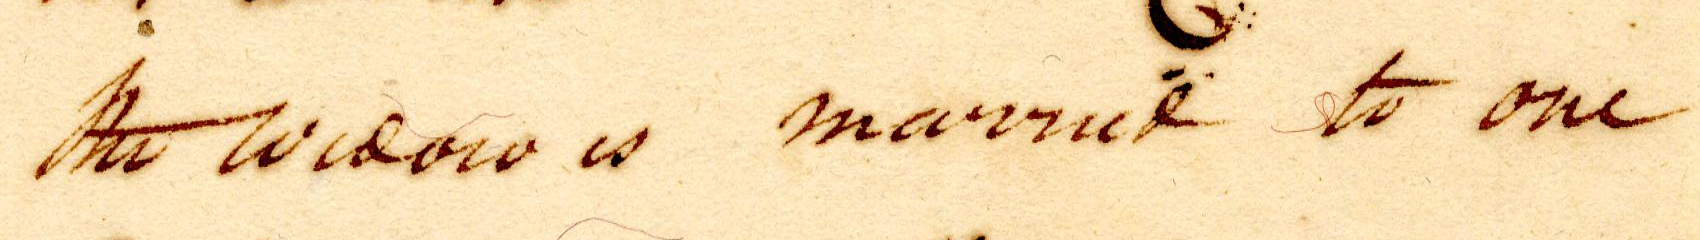the widow is married to one
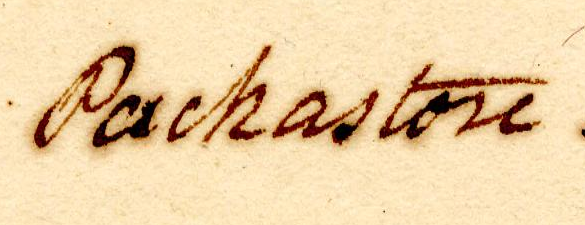Packastore.
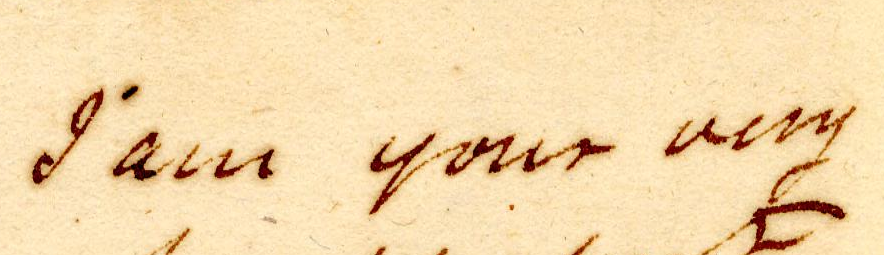I am your very
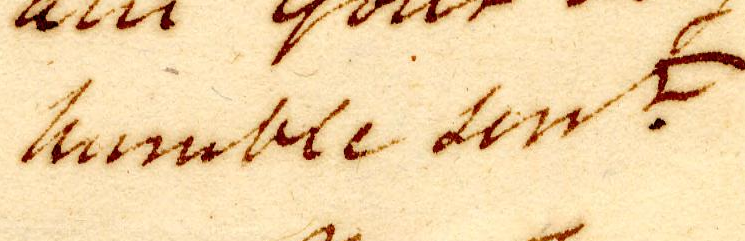humble serv^t.
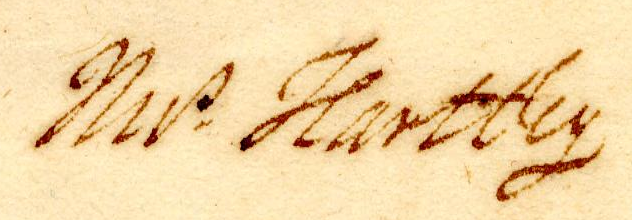M^r Hartley
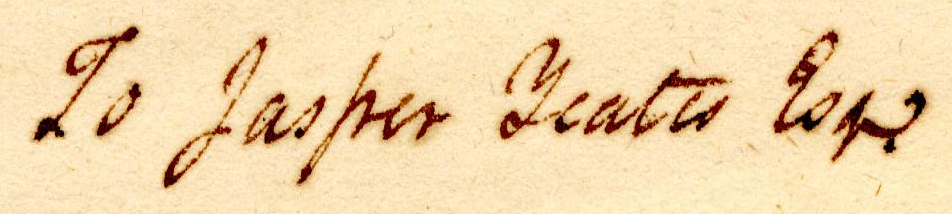To Jasper Yeates Esq.
